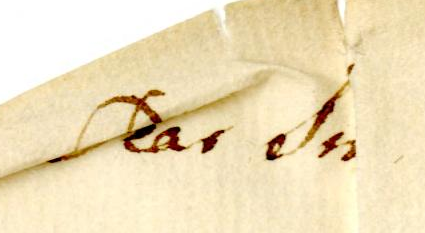Dear Sir
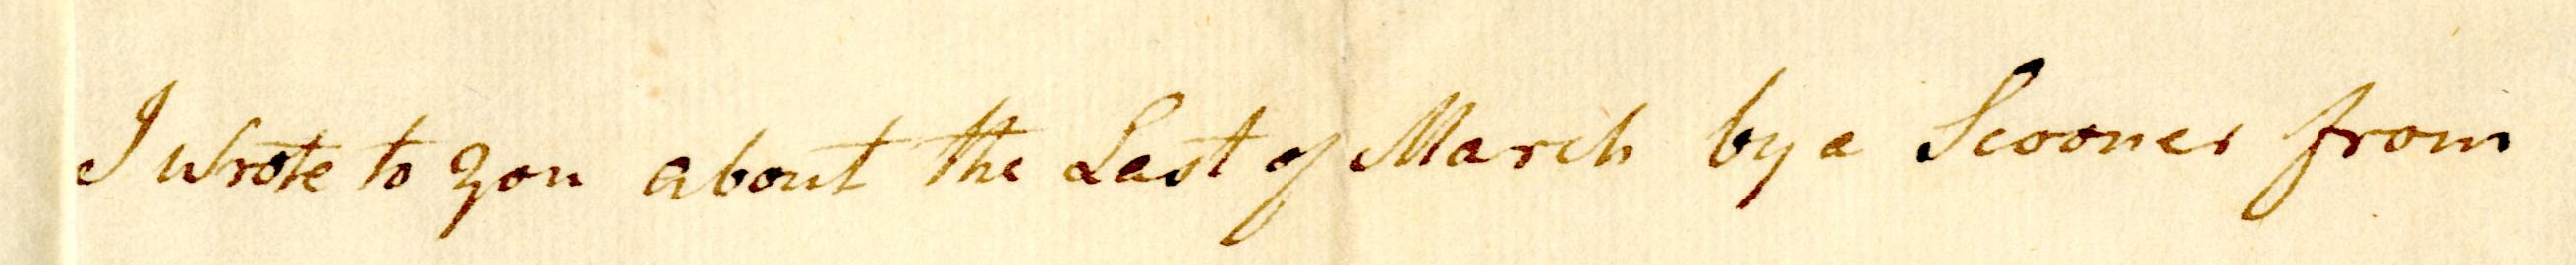I wrote to you about the Last of March by a scooner from
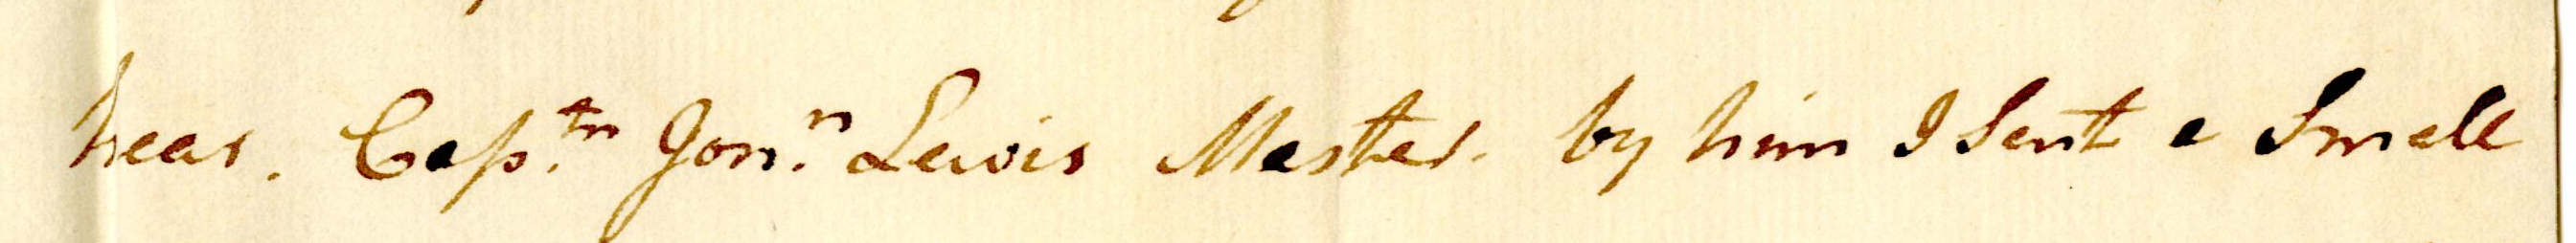hear. Cap^tn. Jon^n. Lewis Master by him I sent a Small
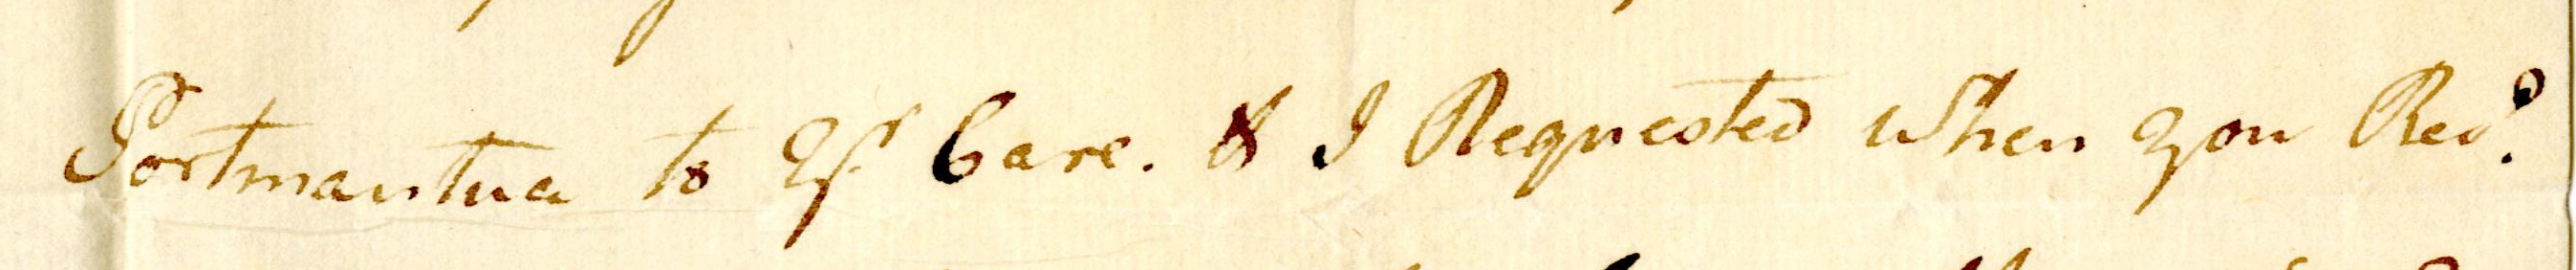Portmantua to Y^r. Care. & I Requested when you Rec^d.
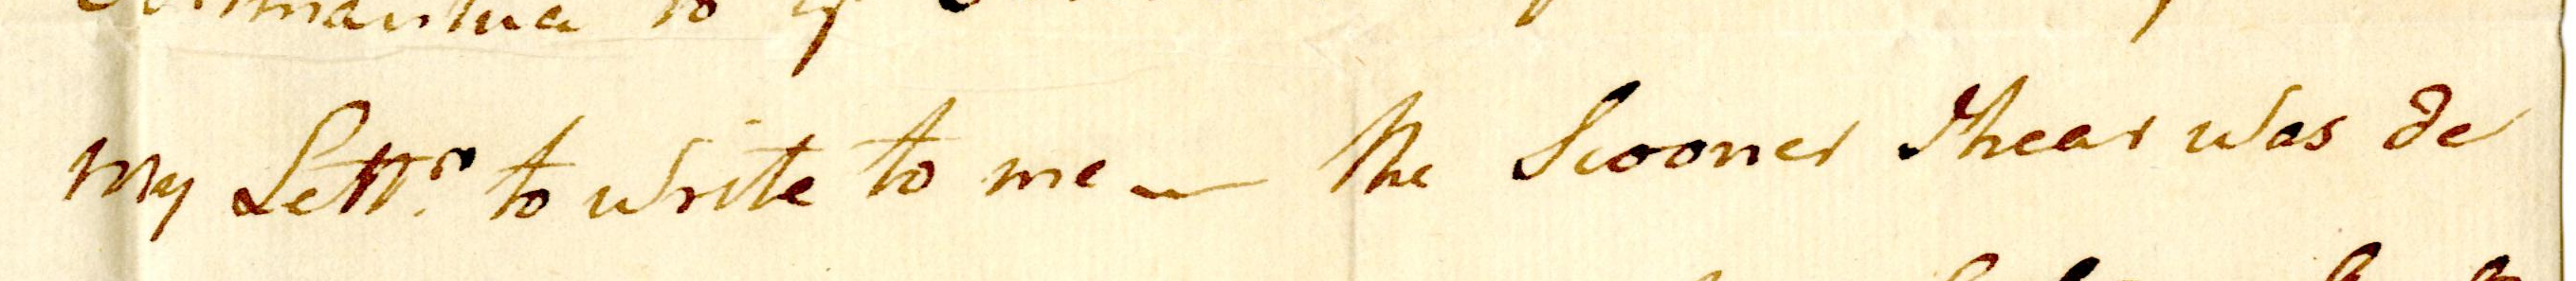My Lett^r. to write to me- the Scooner I hear was de
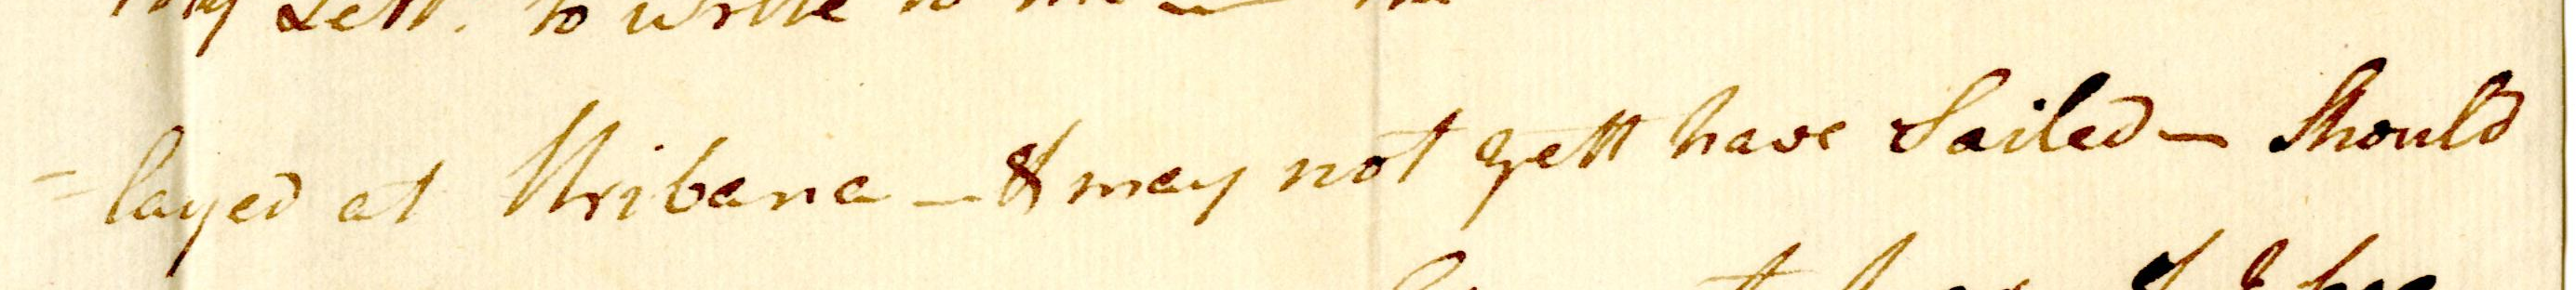-layed at Uribana- & may not yett have Sailed- should
